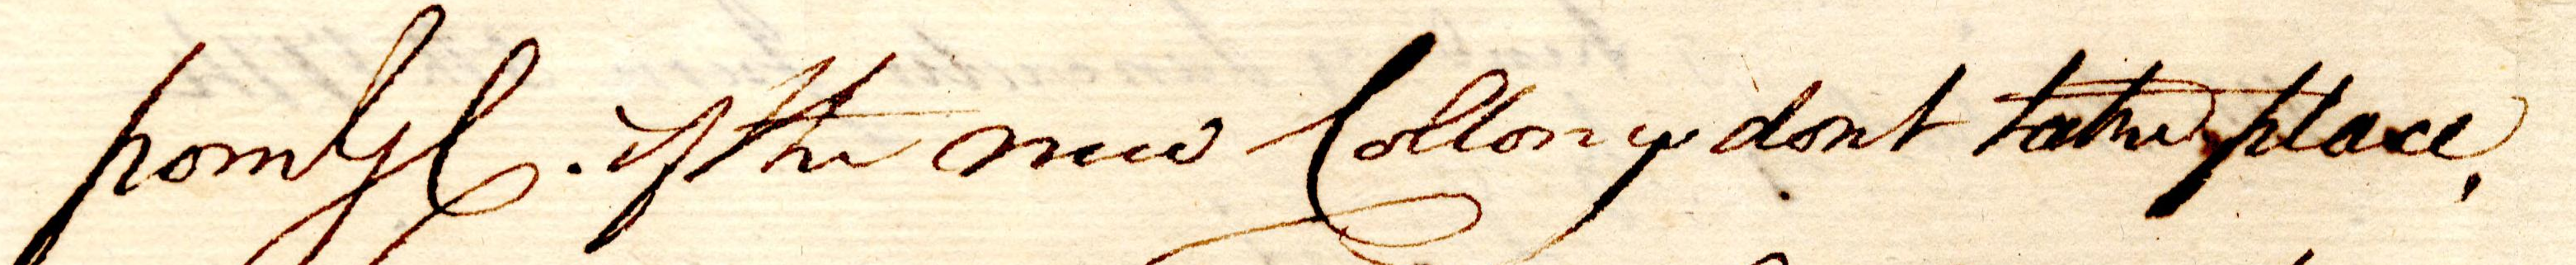homly. if the new Collony dont take place,
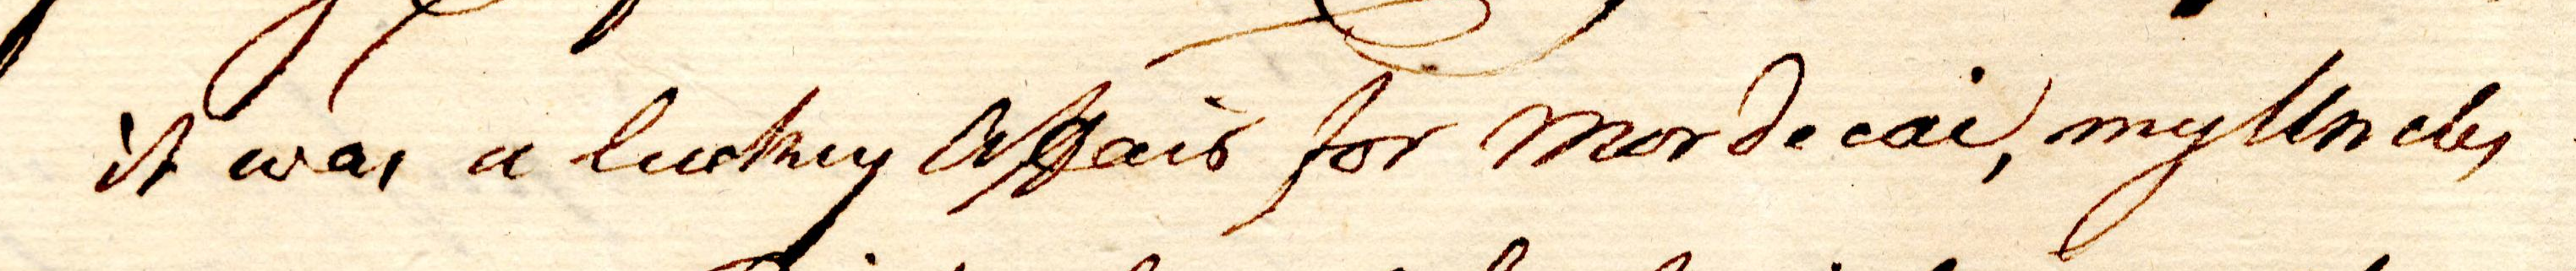it was a luckey afair for Mordecai, my Uncles
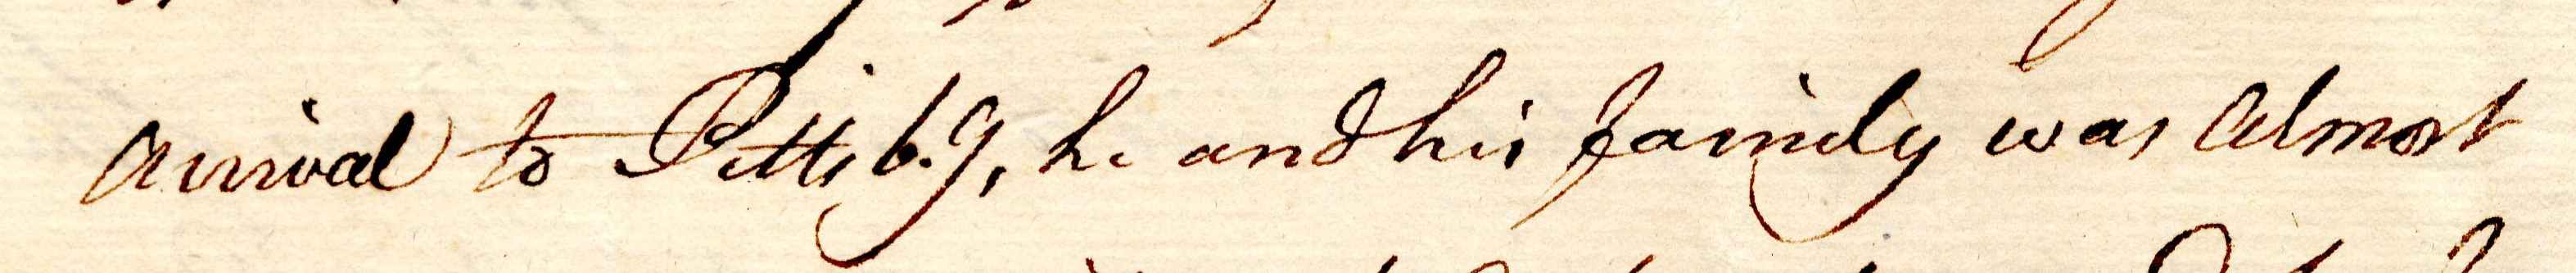Arrival to Pittsb^g, he and his family was Almost
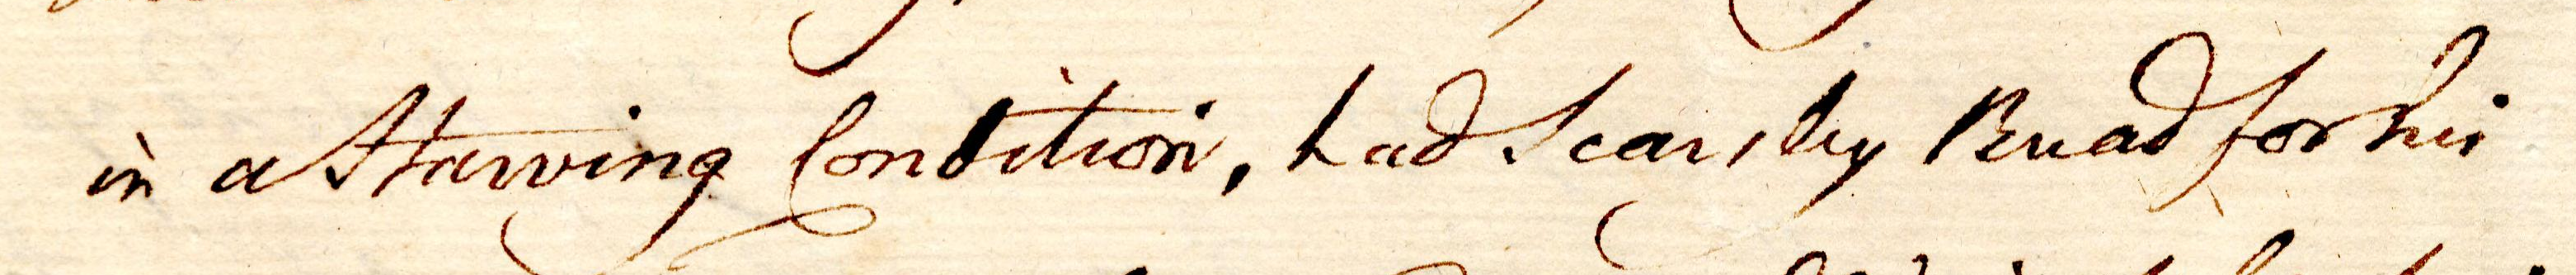in a Starving Condition, had scarsly Bread for his
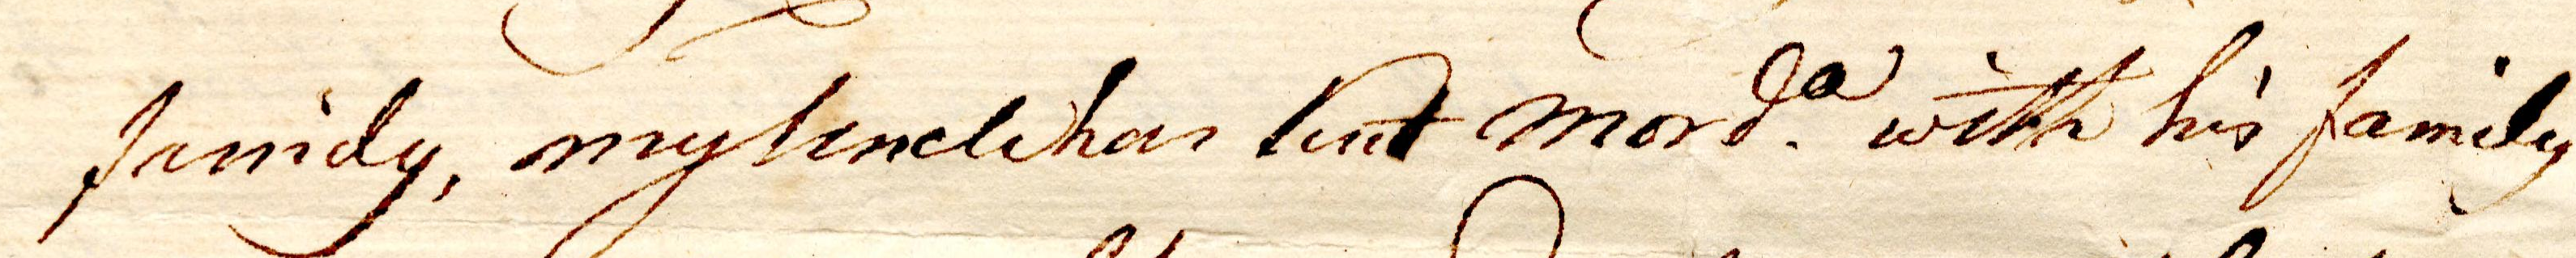family, my uncle has sent mord^a. with his family
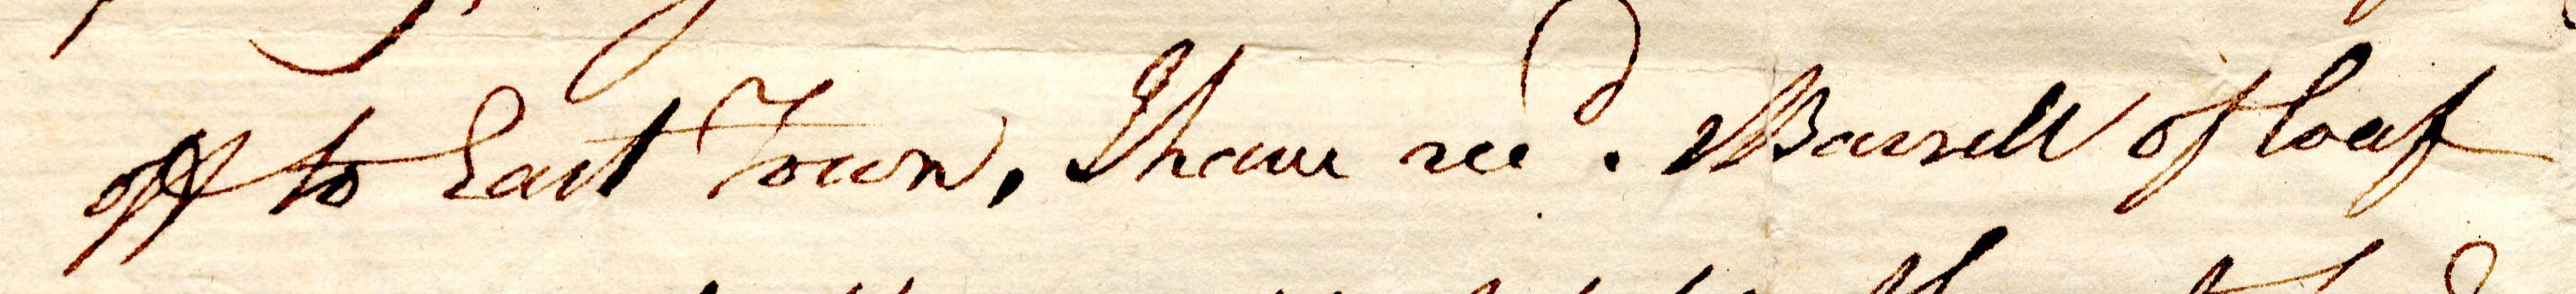off to East Town, I have rec^d. Barrell of loaf
